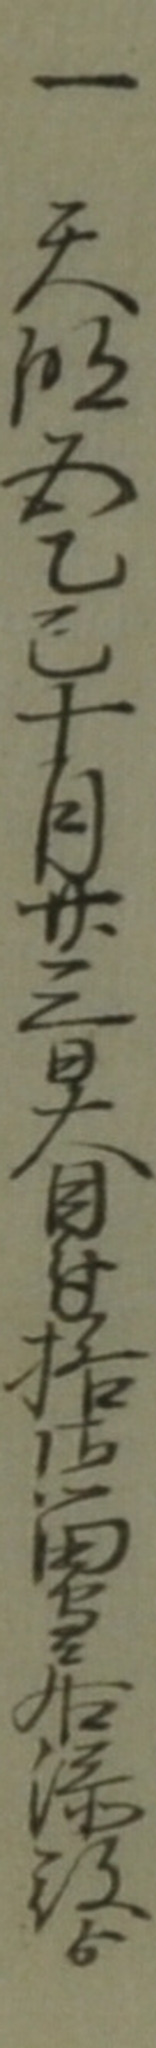一天明五乙巳十月廿三日大目付格御留守居添役ゟ
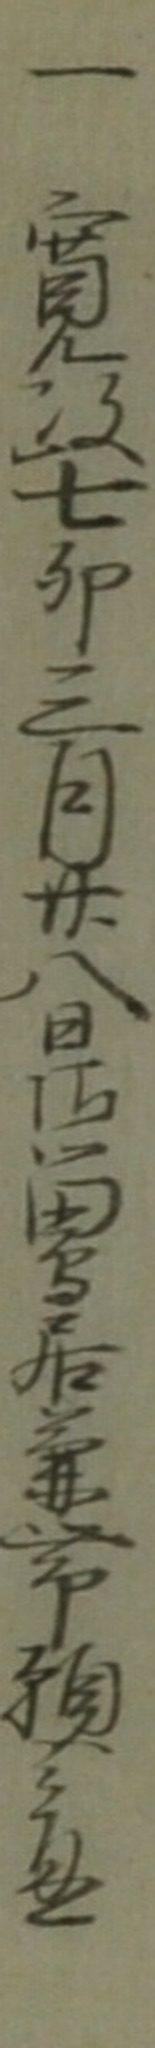一寛政七卯三月廿八日御留守居兼帯願之通
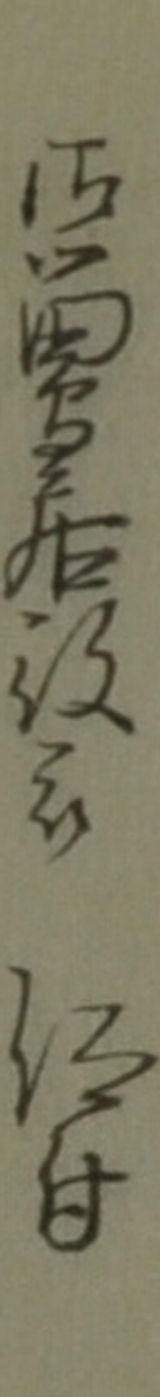御留守居役被仰付
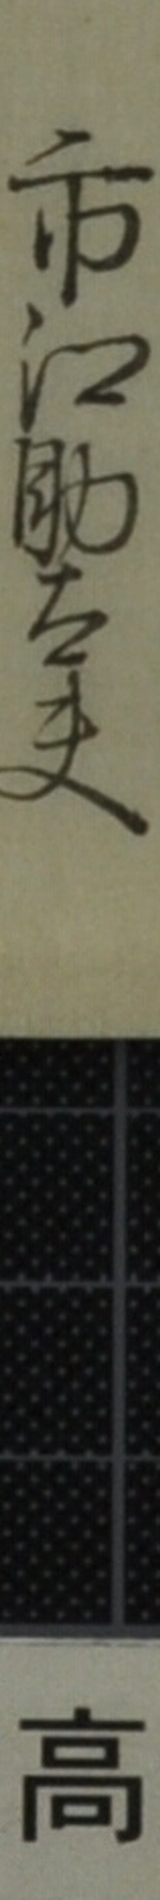市江助太夫
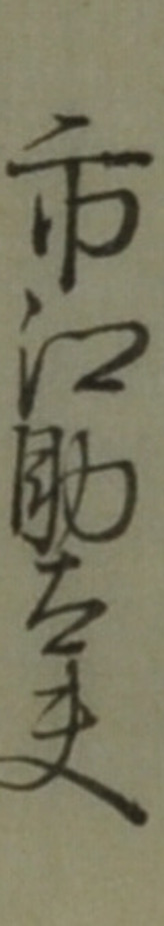市江助太夫
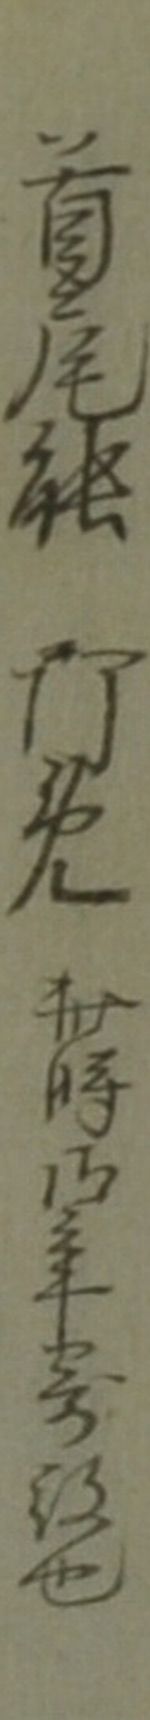首尾能御免此時御年寄役也
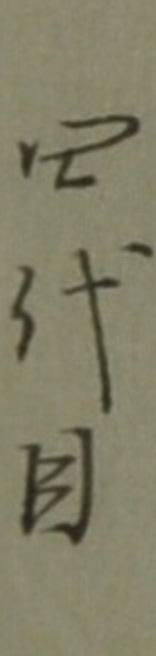四代目
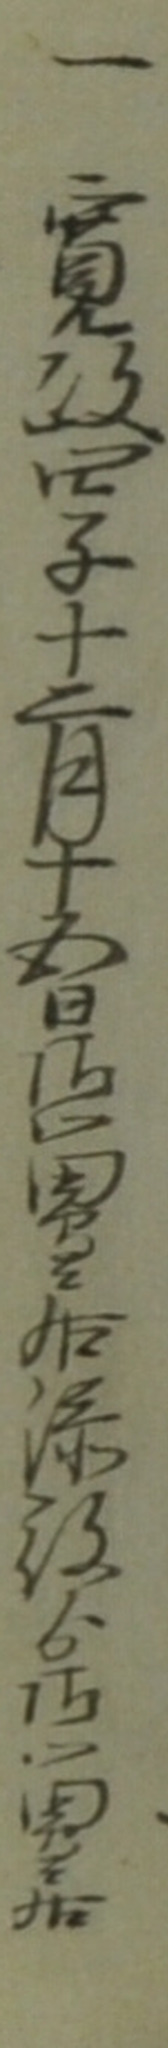一寛政四子十二月十五日御留守居添役ゟ御留守居
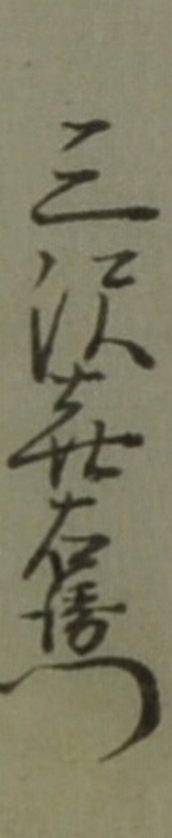三沢喜右衛門

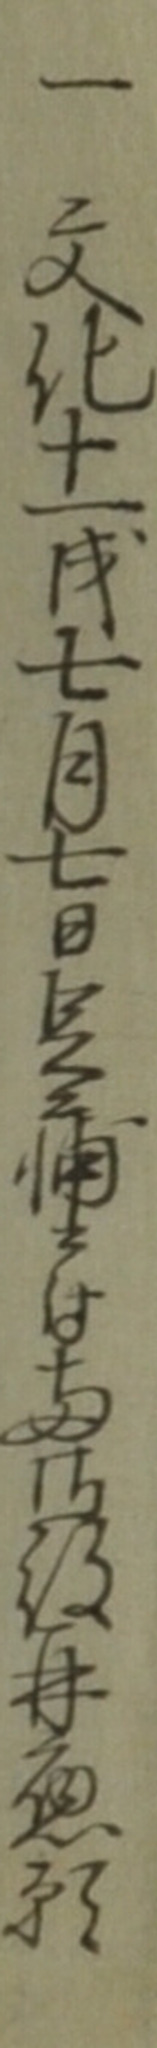一文化十一戌七月七日足痛ニ付両御役再応願
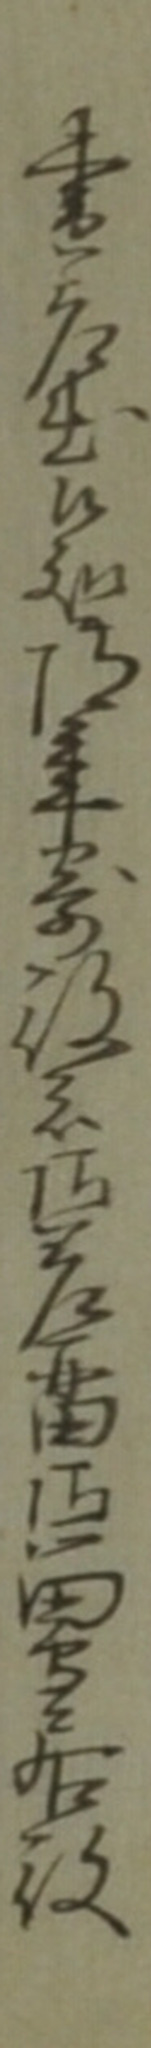書差出候処御年寄役者御差留御留守居役
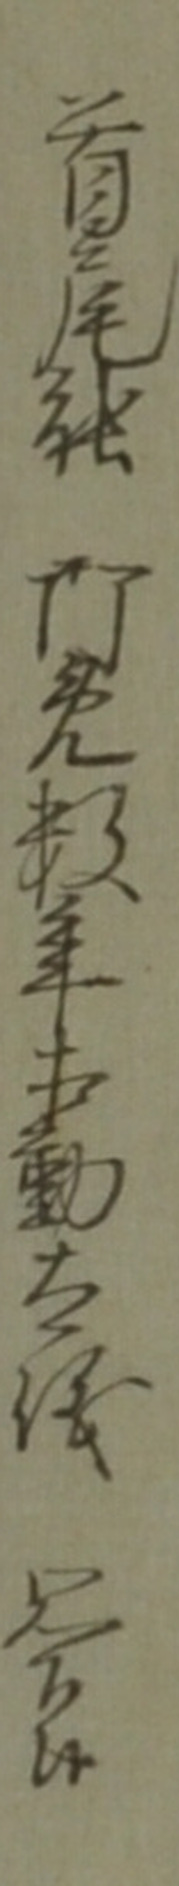首尾能御免数年相勤太儀思召候
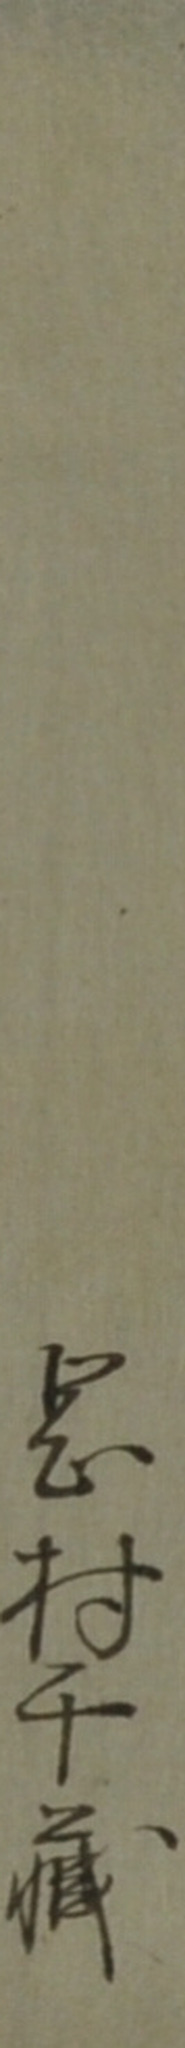岡村千蔵
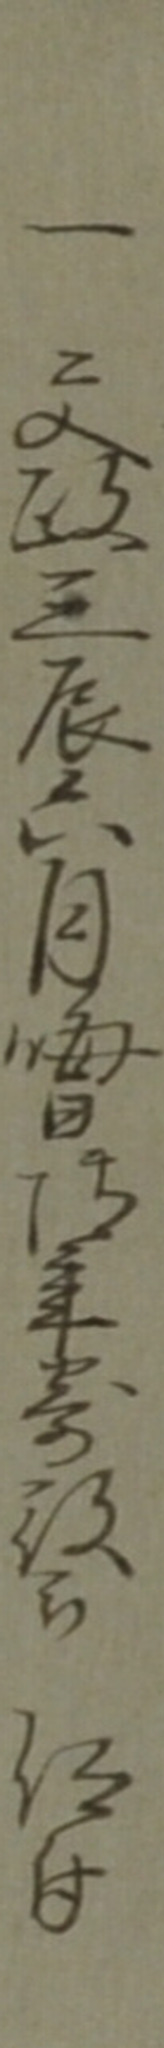一文政三辰六月晦日御年寄役被仰付
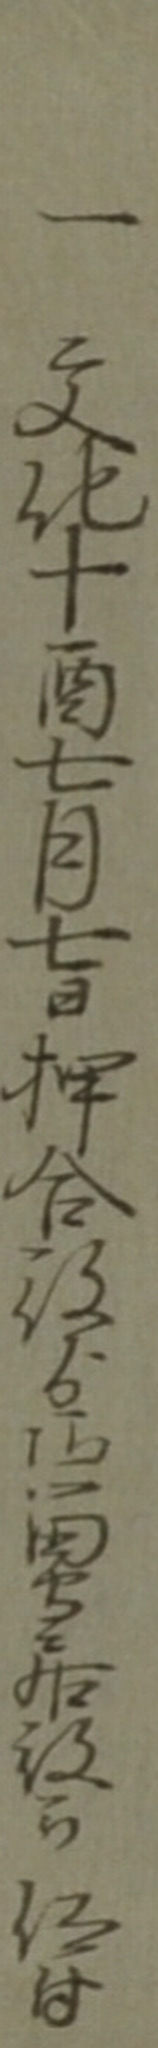一文化十酉七月七日押合役ゟ御留守居役被仰付
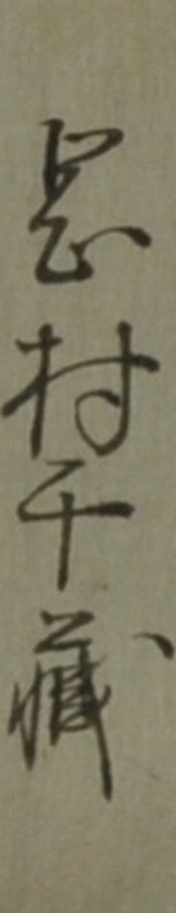岡村千蔵
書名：諸御役代々録（三）
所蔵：伊那市立高遠町図書館・合同会社AMANE
